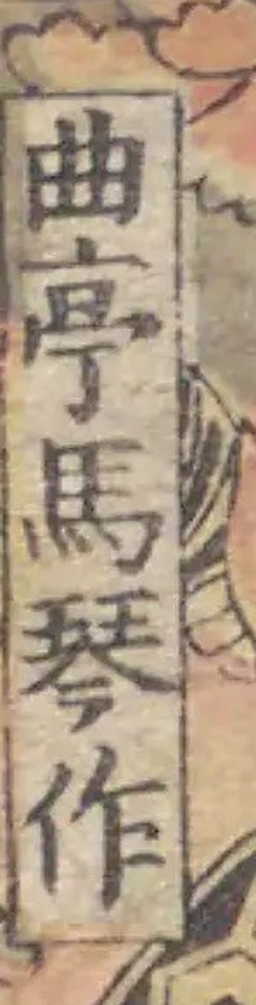曲亭馬琴作

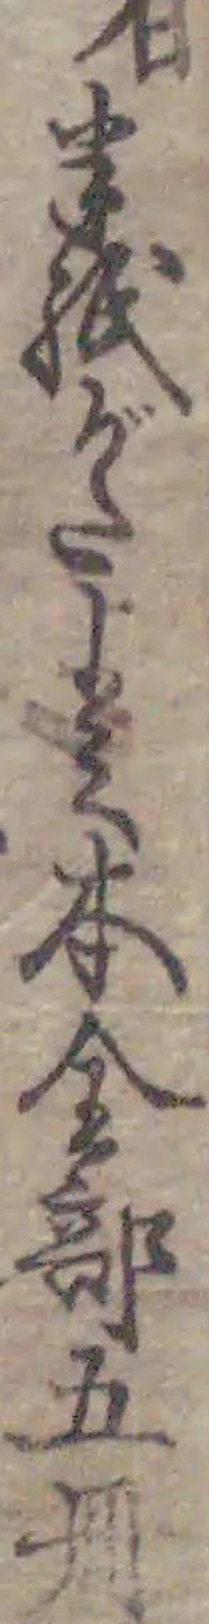半紙がたよみ本全部五冊
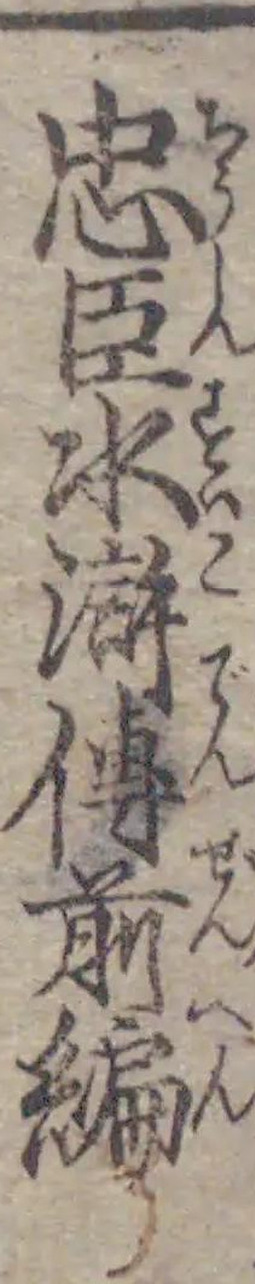忠臣水滸伝前編
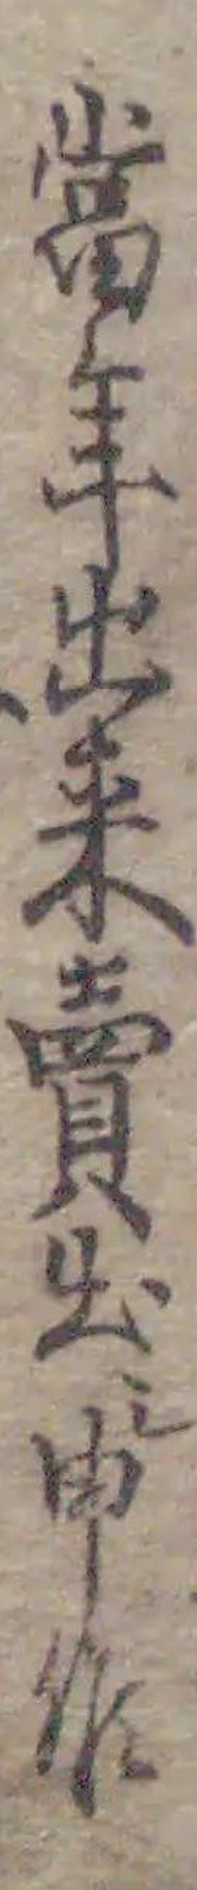当年出来売出し申候
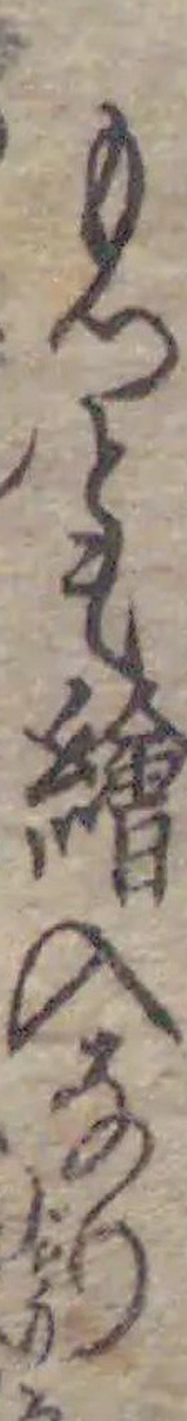もつとも絵入なり
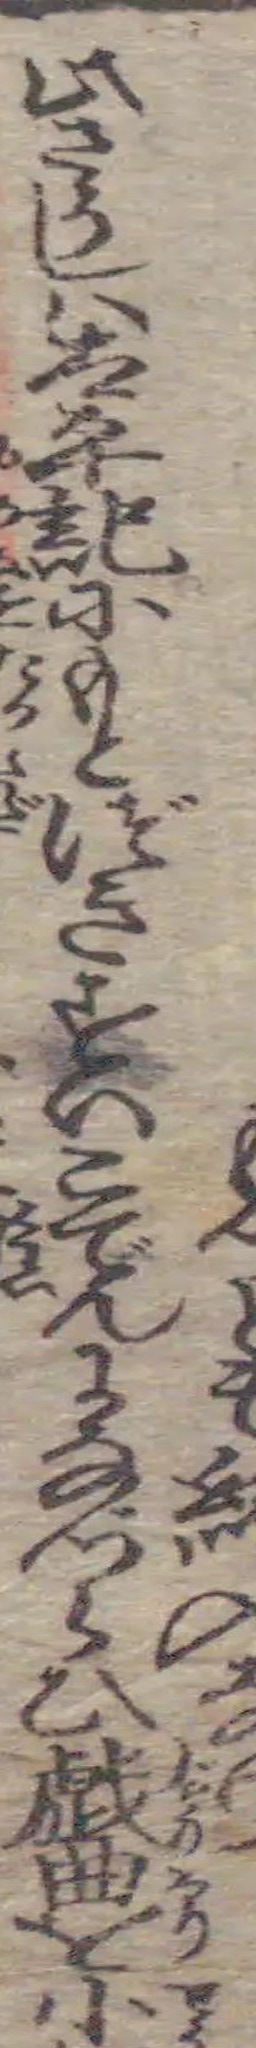此さうしは太平記にもとづきすいこでんになづらひ戯曲小説の
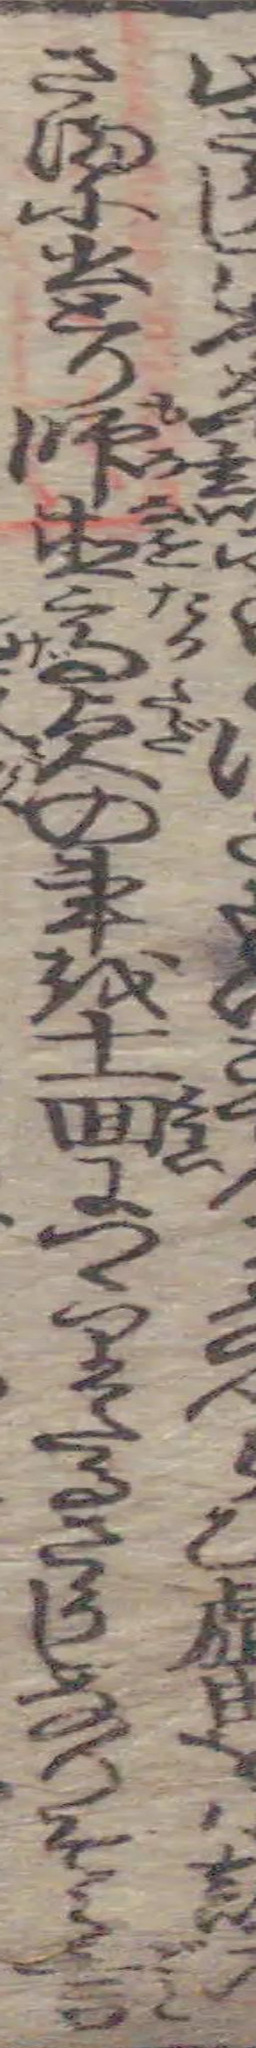さまに書とり師直高貞の事を十一回につゝりたるさうしなそら言
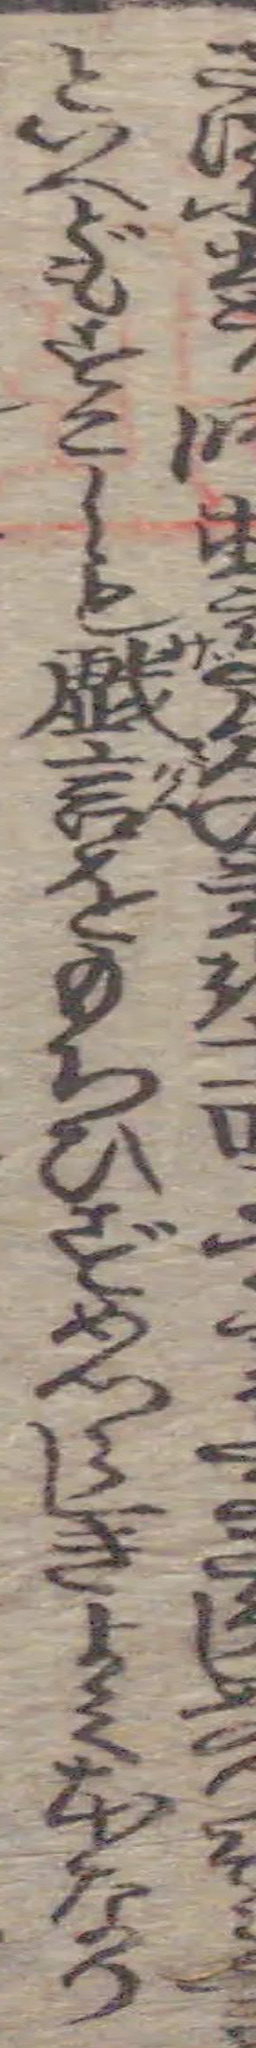といへどもすこしも戯言をもちひずめつらしきよみ本なり
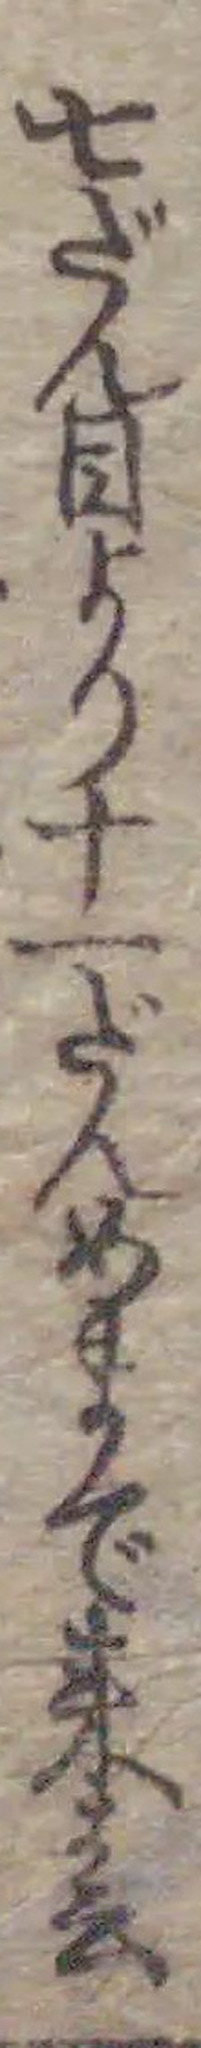七だん目より十一だんめまで来春
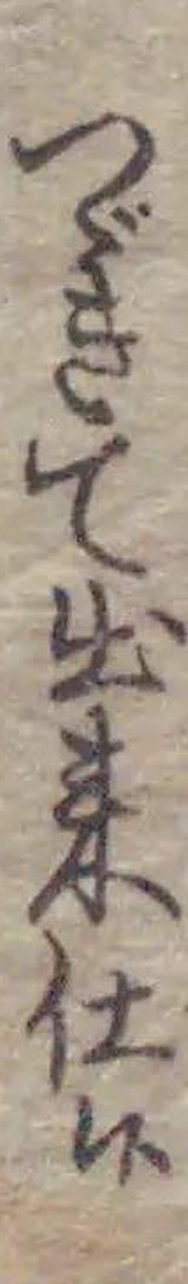つゞきて出来仕候
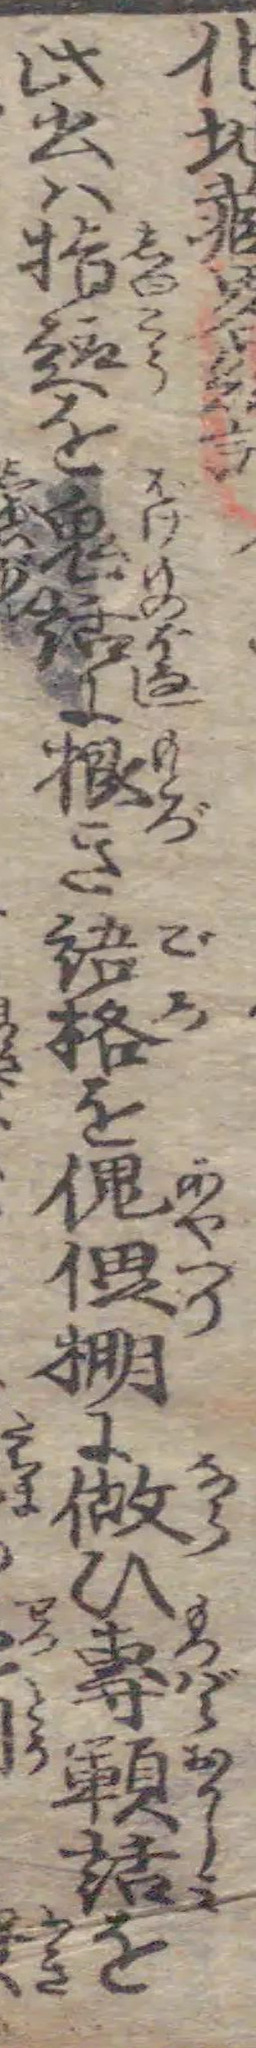此書は指向を鬼話に根き語各を傀儡棚に倣ひ専顐話を
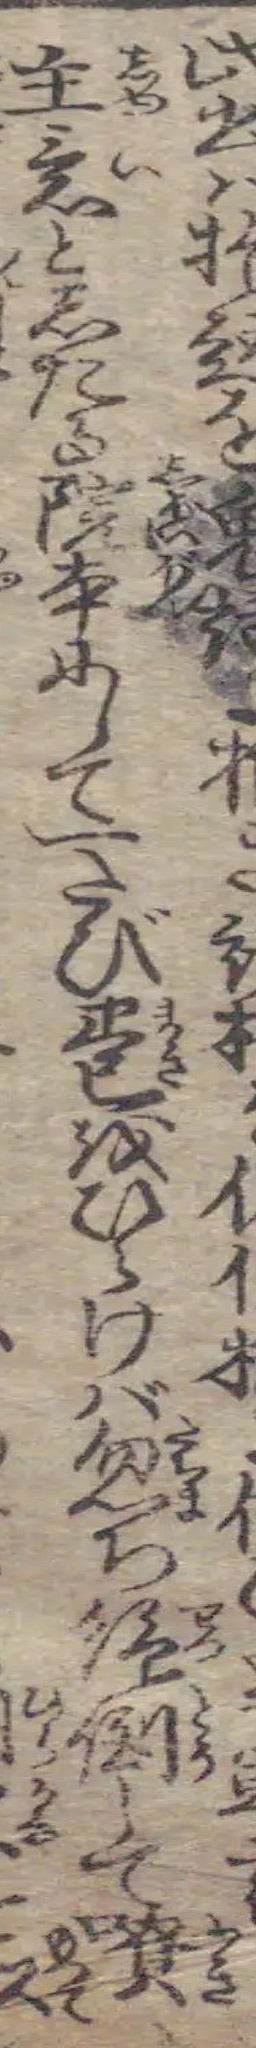主意としたる院本にして一たび巻しらけば忽ち絶倒して噴
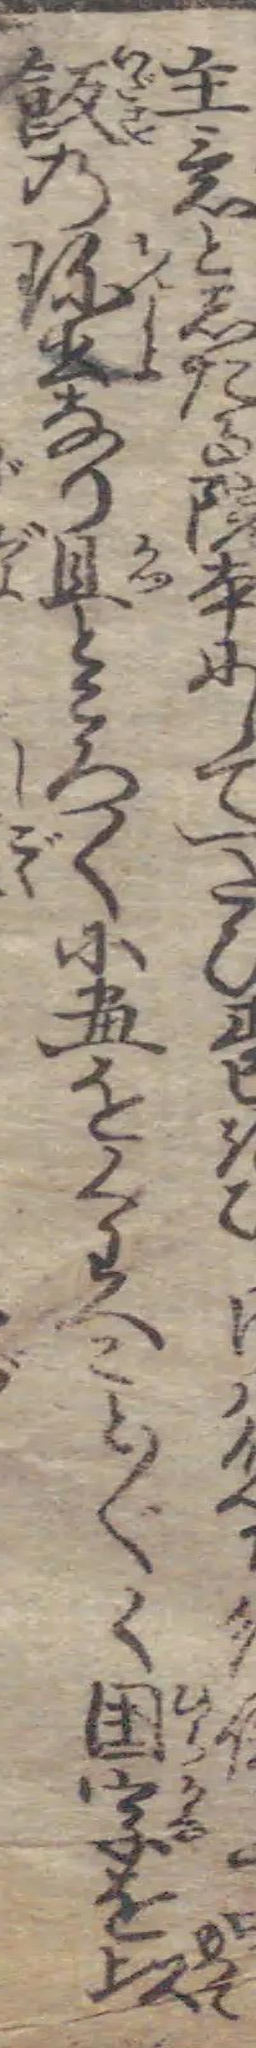飯の珍書なり且ところ〳〵に画をくわへこと〴〵く国字を以
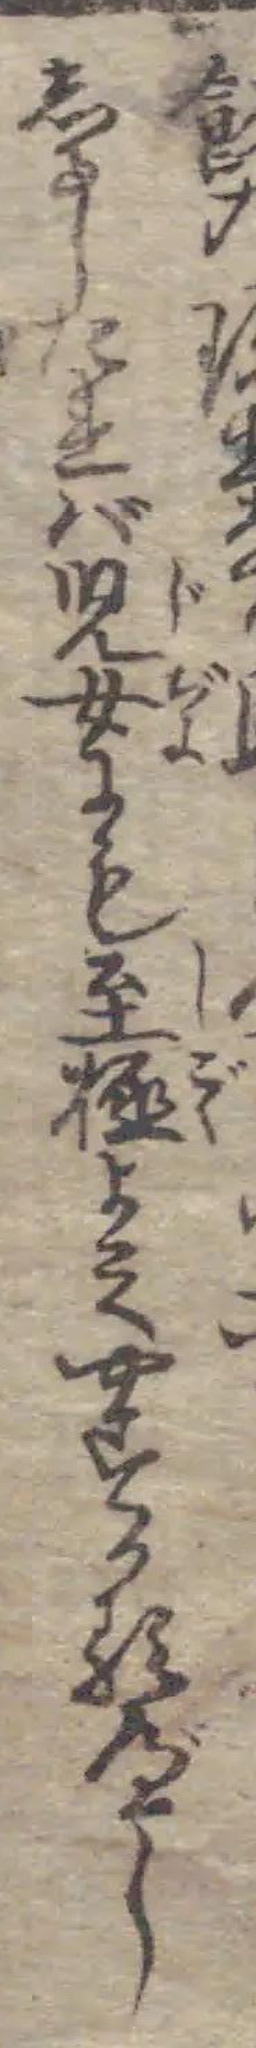しるしたれば児女にも至極よみやすかるべし
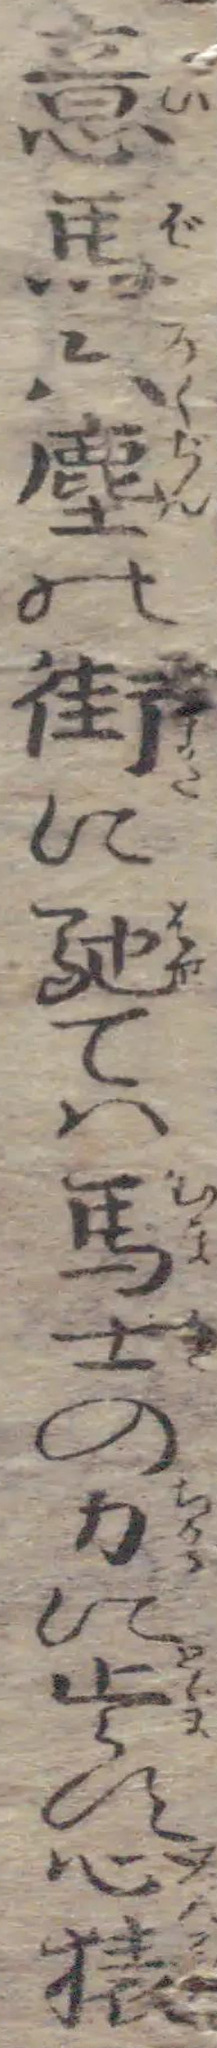意馬六塵の街に馳ては馬士の力に止らす心猿
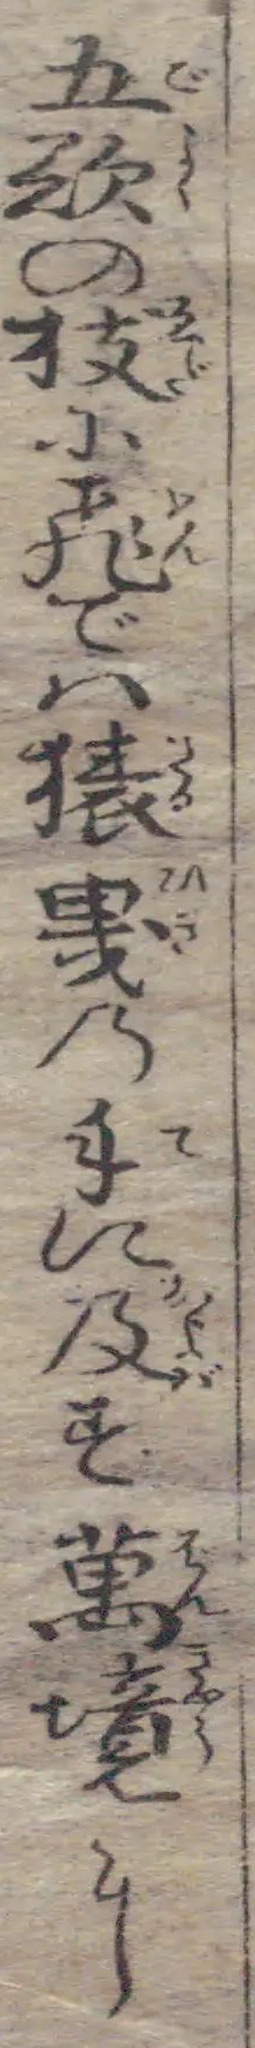五欲の枝に飛では猿曳の手に及す万境に
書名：福壽海旡量品玉 3巻
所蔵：国立国会図書館 National Diet Library, JAPAN
